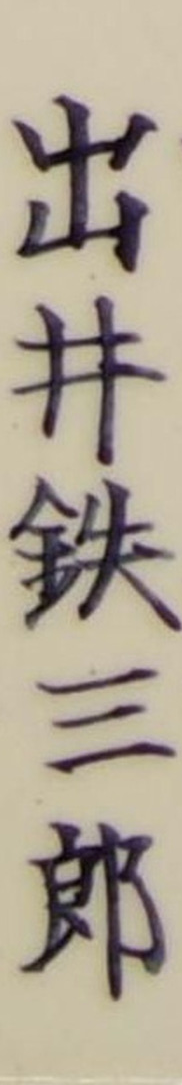出井鉄三郎

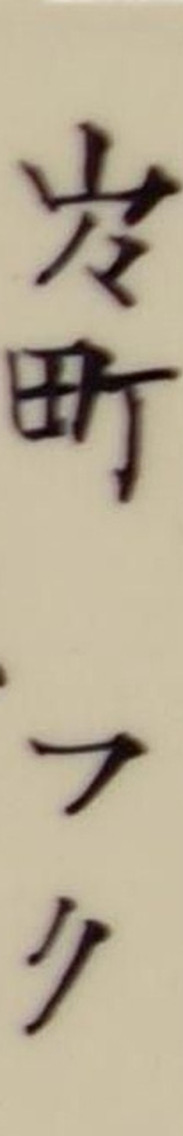出町フク
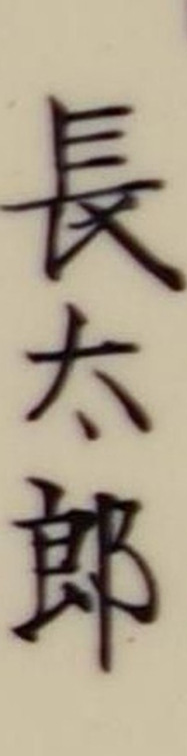長太郎
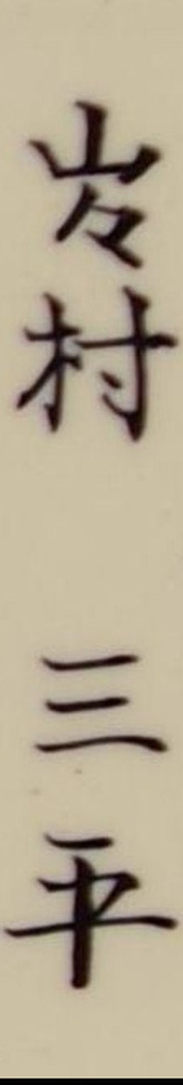出村三平
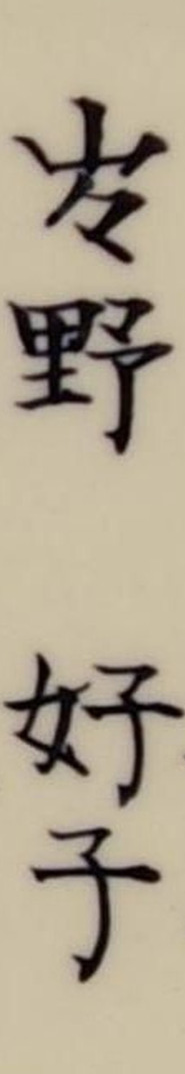出野好子
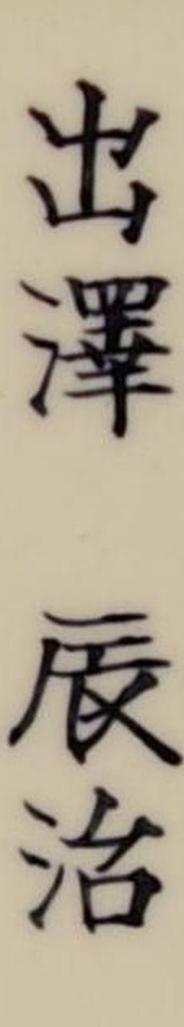出澤辰治
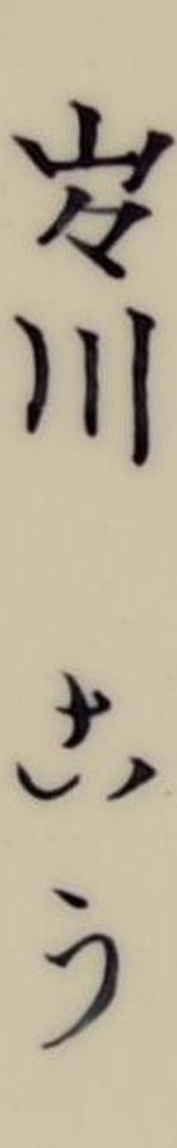出川こう
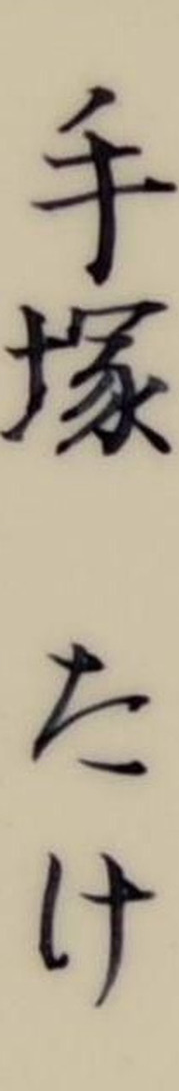手塚たけ
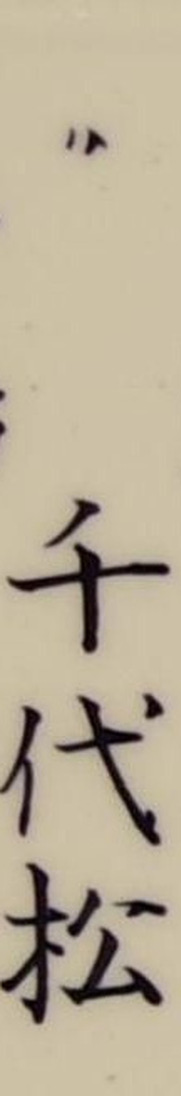千代松
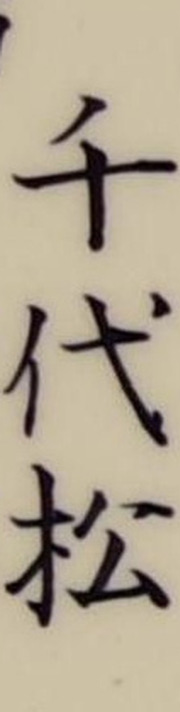千代松
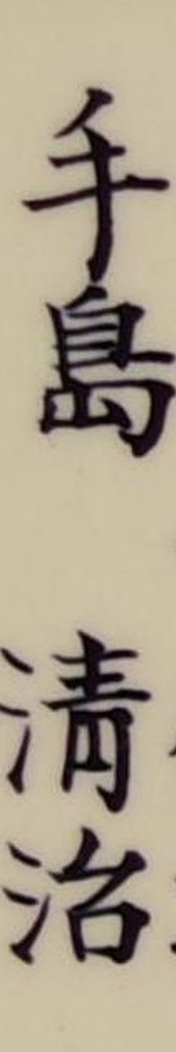手島清治
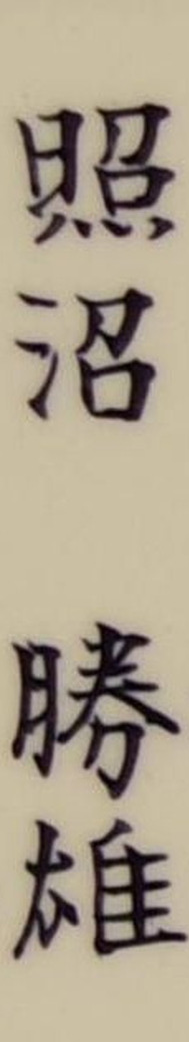照沼勝雄
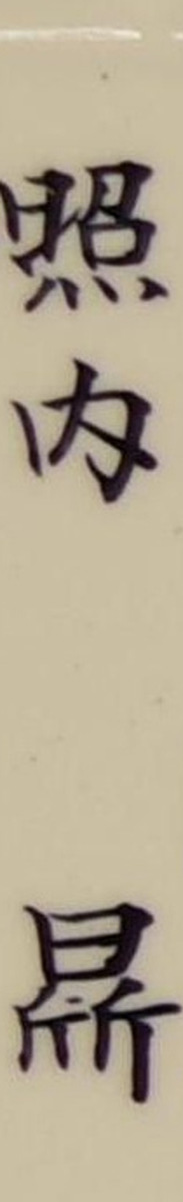照内晁
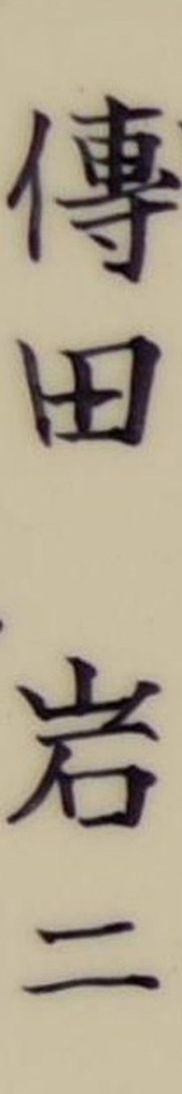傳田岩二
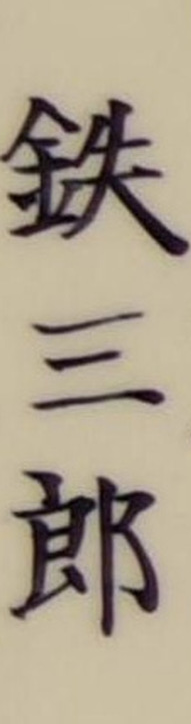鉄三郎
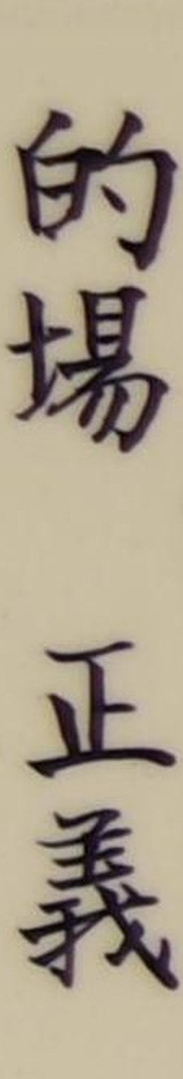的場正義
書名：E~L
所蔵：高野山金剛峯寺
